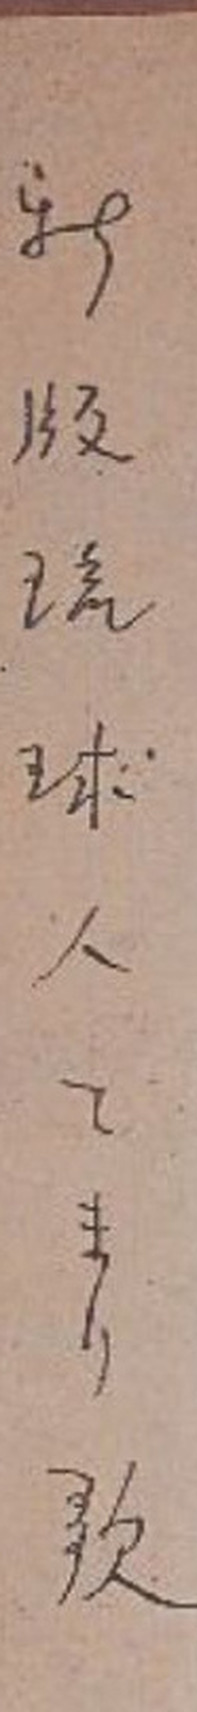新版琉球人てまり歌

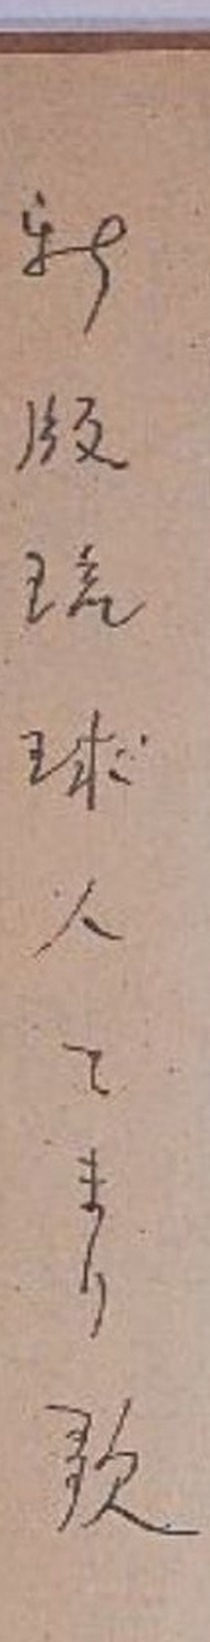新版琉球人てまり歌
